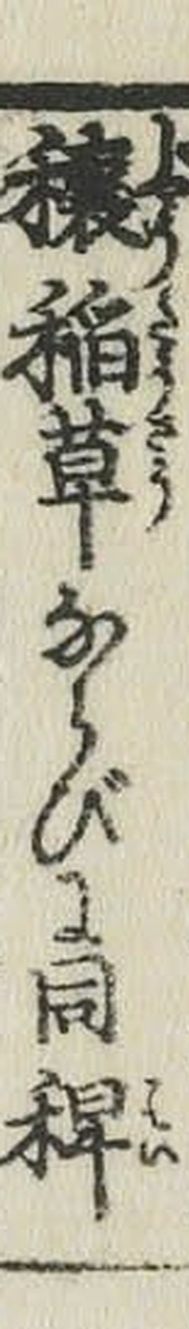穣稲草ならびに同稈
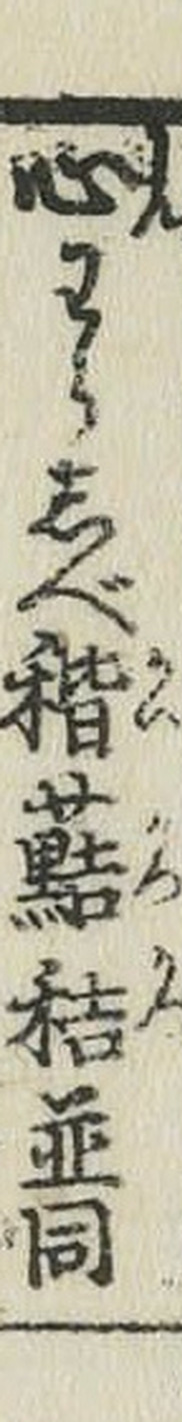心わらしべ稭䕸秸並同
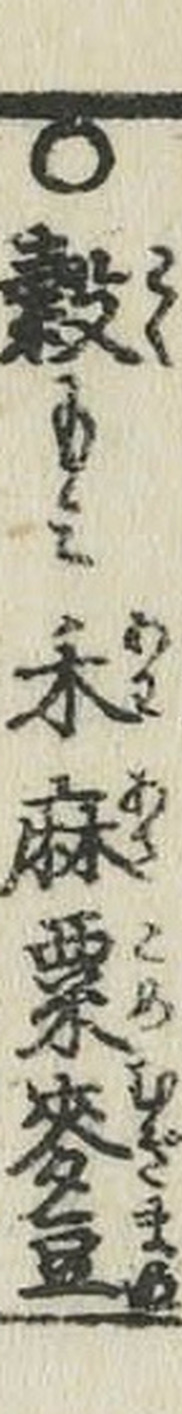○穀もみ禾麻粟麦豆
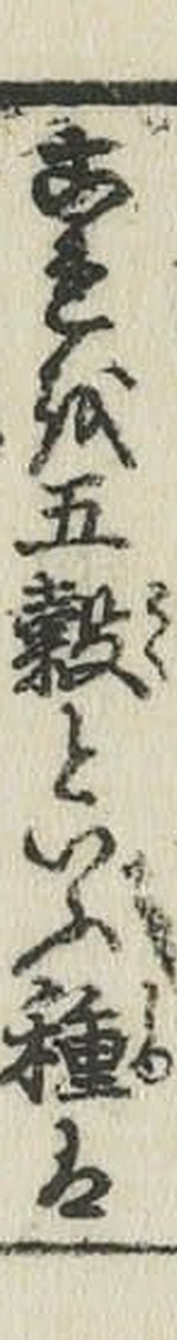これを五穀といふ種は
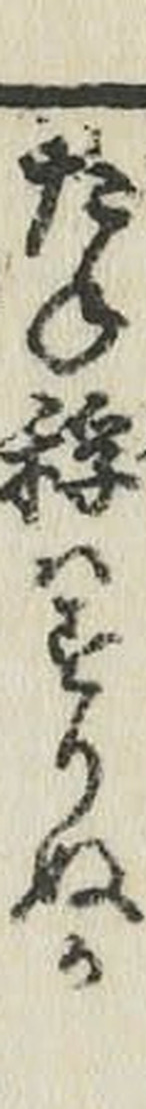たね稃はすりぬか
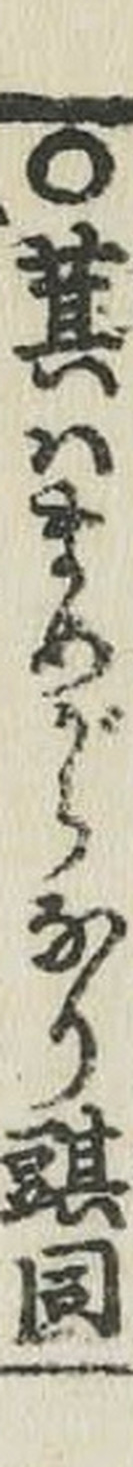○萁はまめがらなり𧯯同
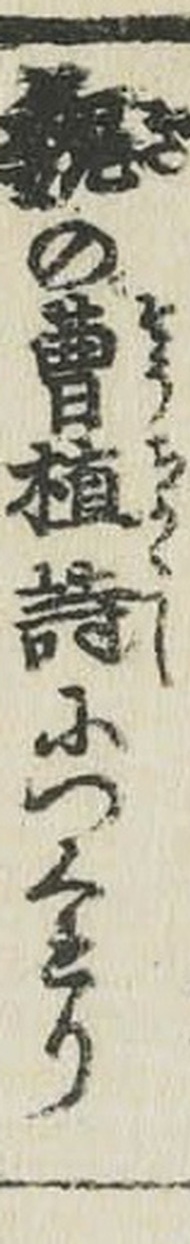魏の曹植詩につくれり
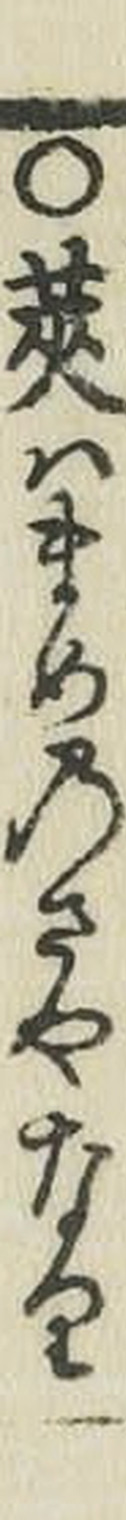○莢はまめのさやなり
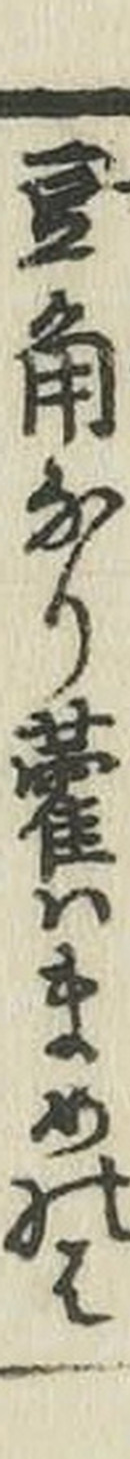豆角なり藿はまめのは
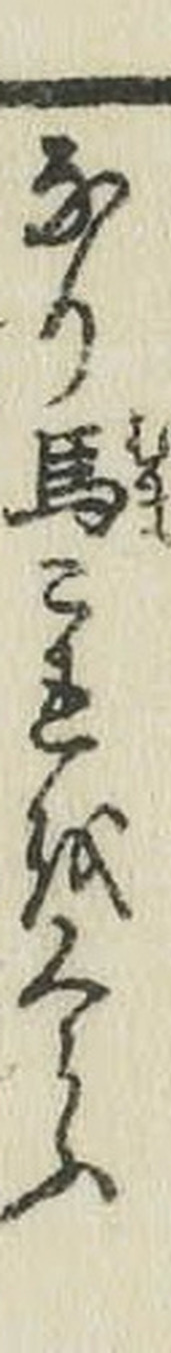なり馬これをくらふ
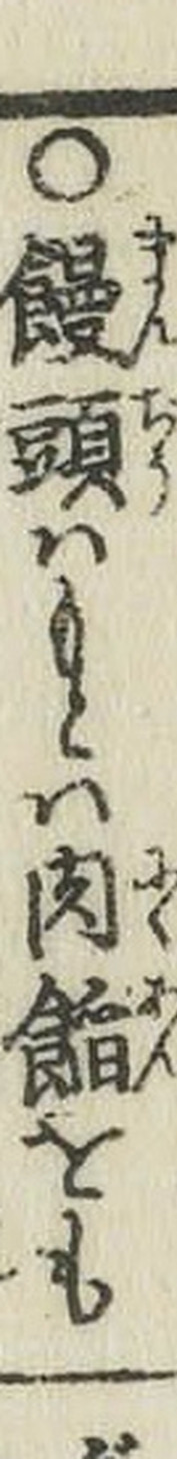○饅頭はもとは肉餡をも
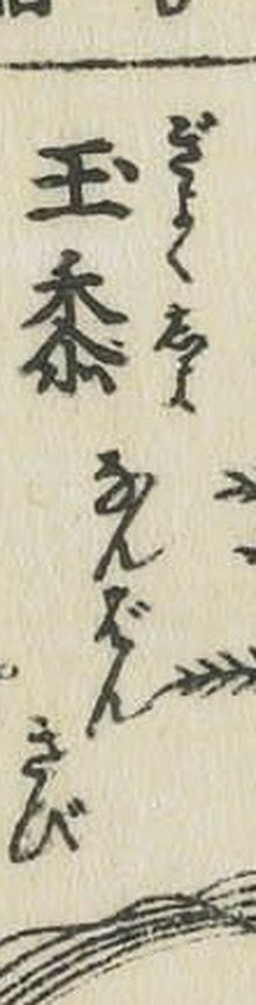玉黍なんばんきび
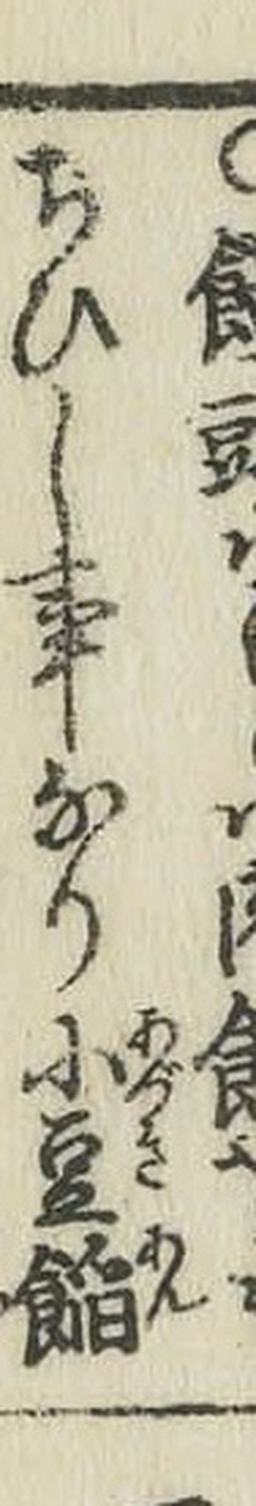ちひし事なり小豆餡
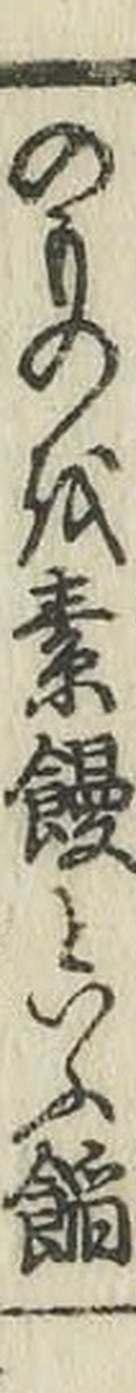のものを素饅といふ餡
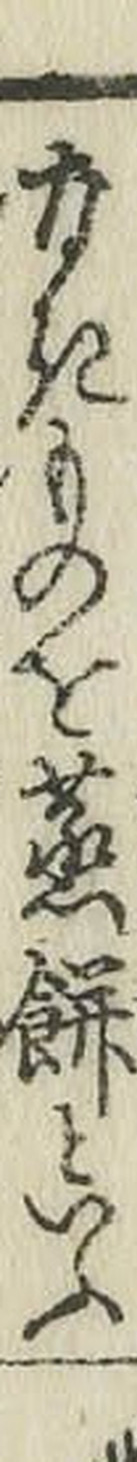なきものを蒸餅といふ
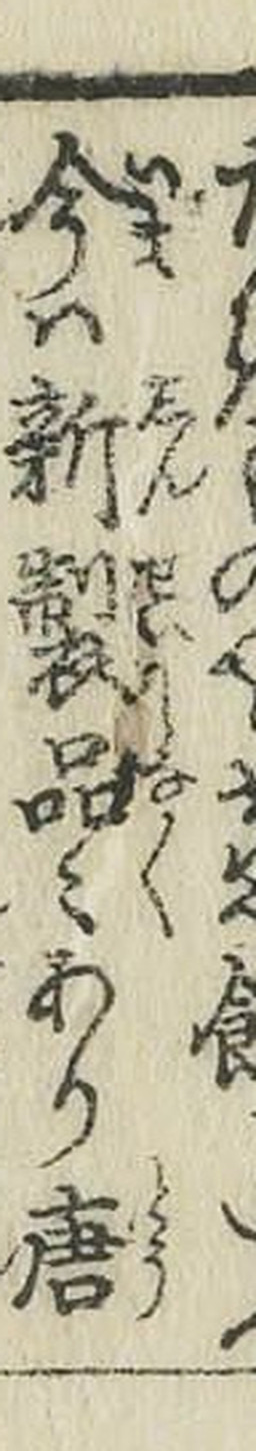今は新製品々あり唐
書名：増補頭書訓蒙図彙大成 10巻 7:巻之14-16
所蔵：東京学芸大学教育コンテンツアーカイブ
